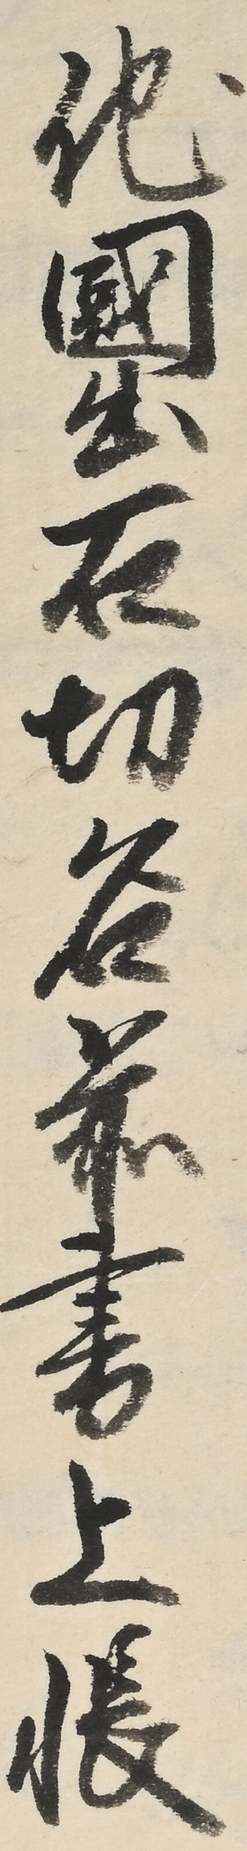他国出石切名前書上帳

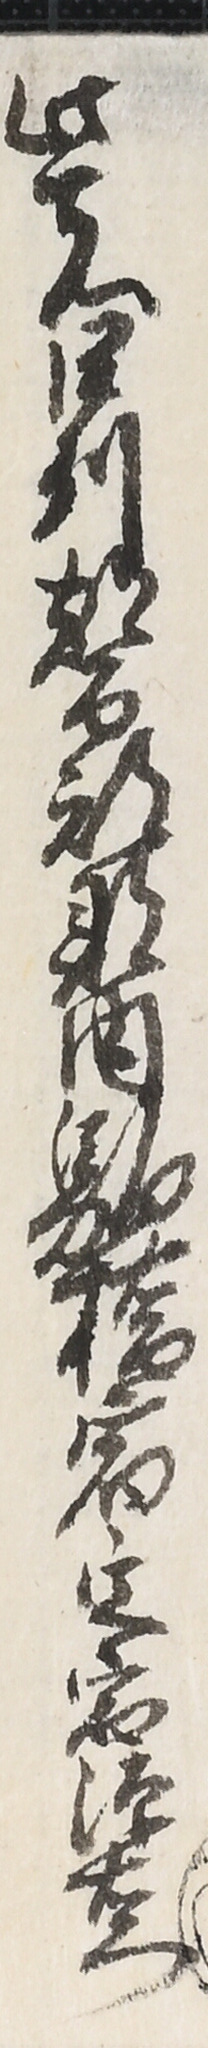此者甲州都留郡郡内駒橋宿定宿源右衛門
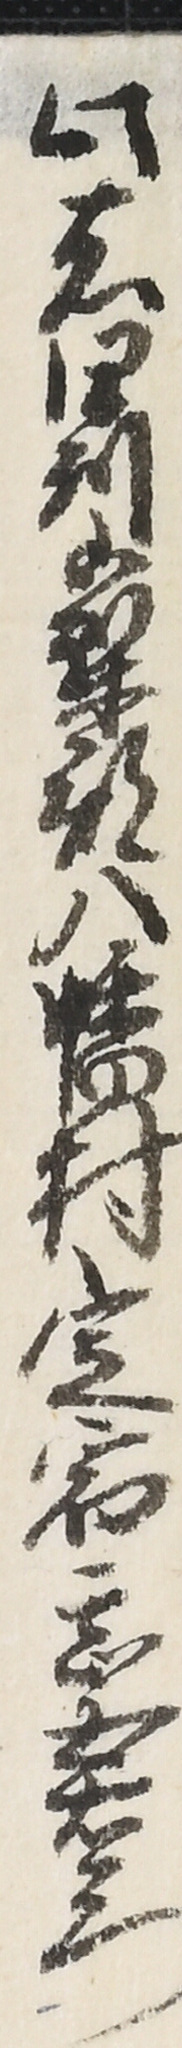此者甲州山梨郡八幡村定宿甚五右衛門
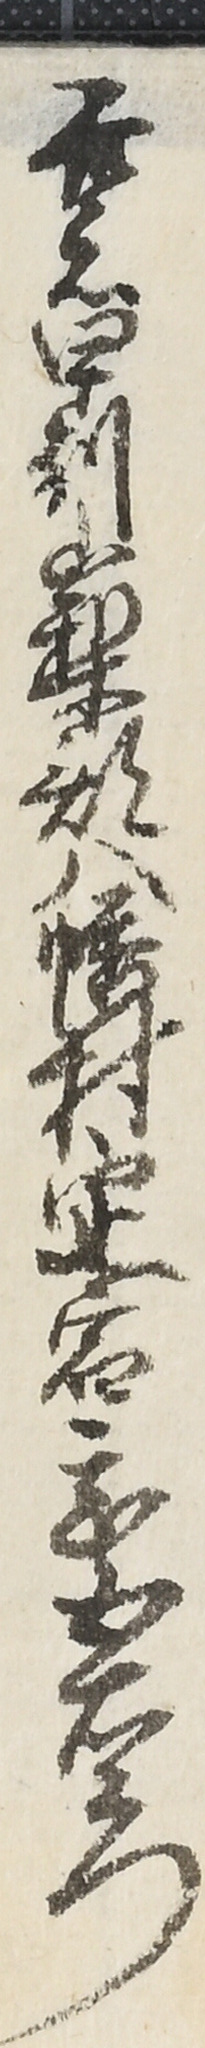此者甲州山梨郡八幡村定宿甚五右衛門
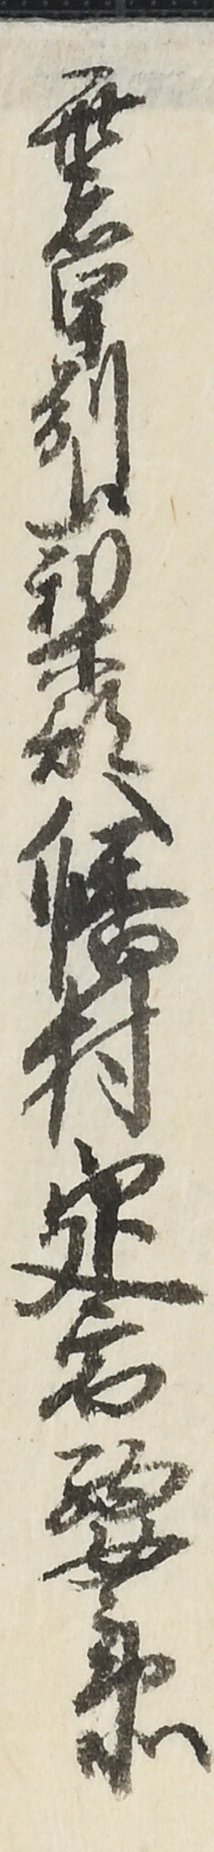此者甲州山梨郡八幡村定宿要兵衛

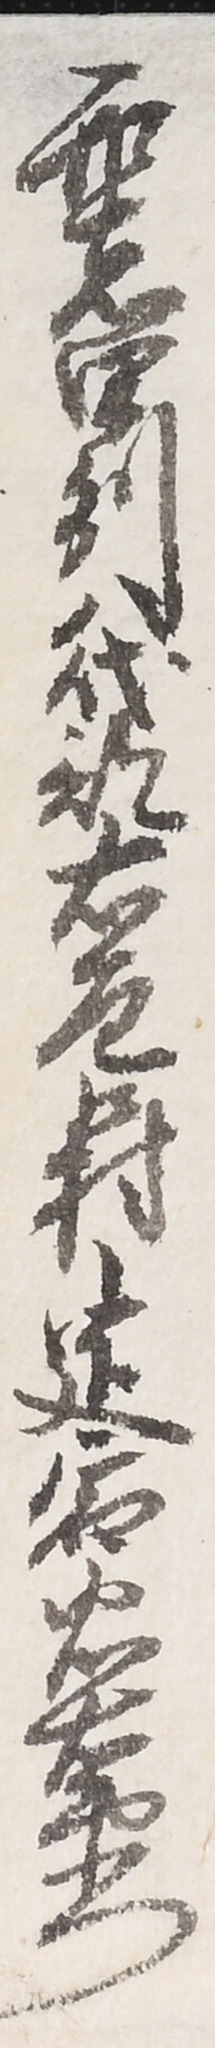此者甲州八代郡右左口村定宿忠右衛門
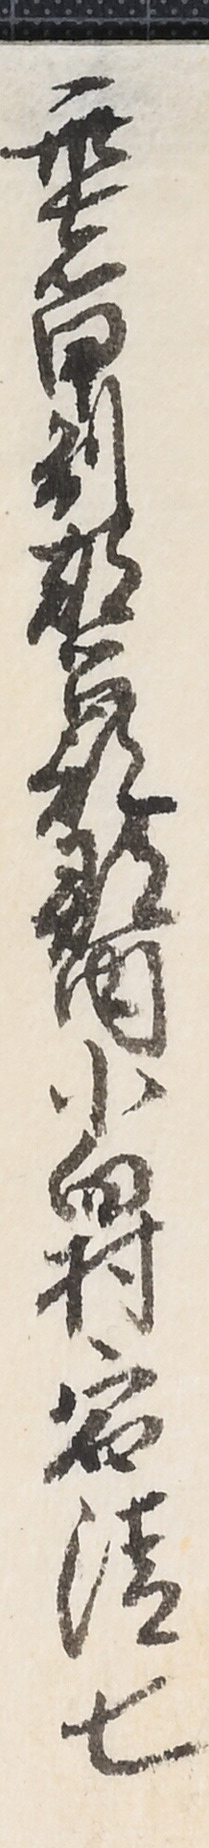此者甲州都留郡郡内小向村宿清七
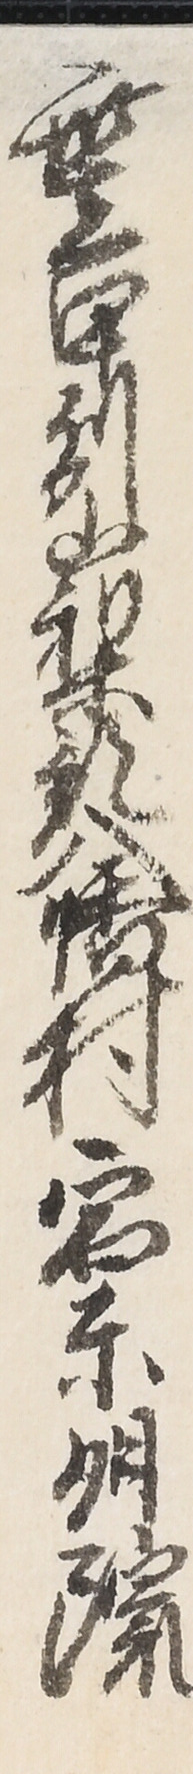此者甲州山梨郡八幡村宿東明院
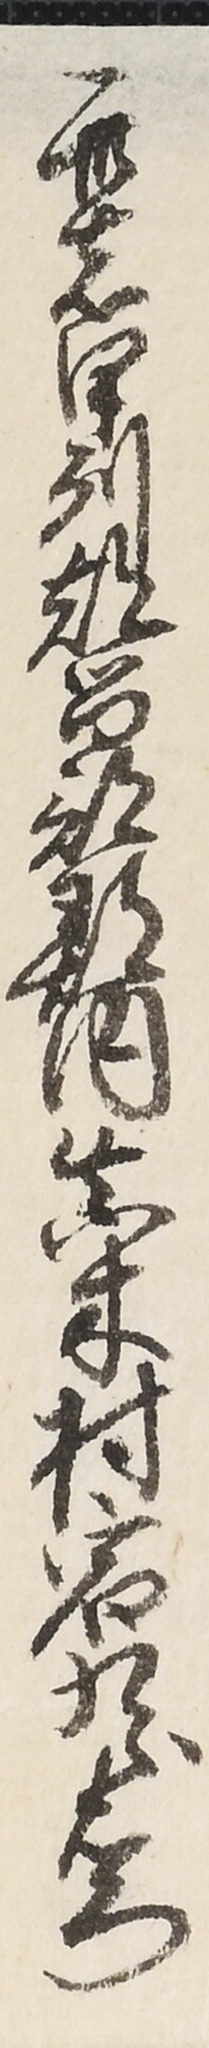此者甲州都留郡郡内真木村宿九郎右衛門
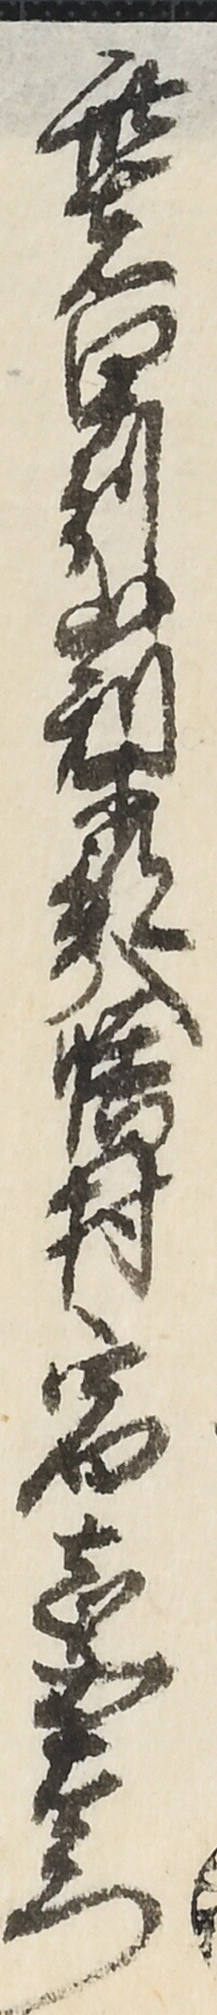此者甲州山梨郡八幡村宿甚五左衛門
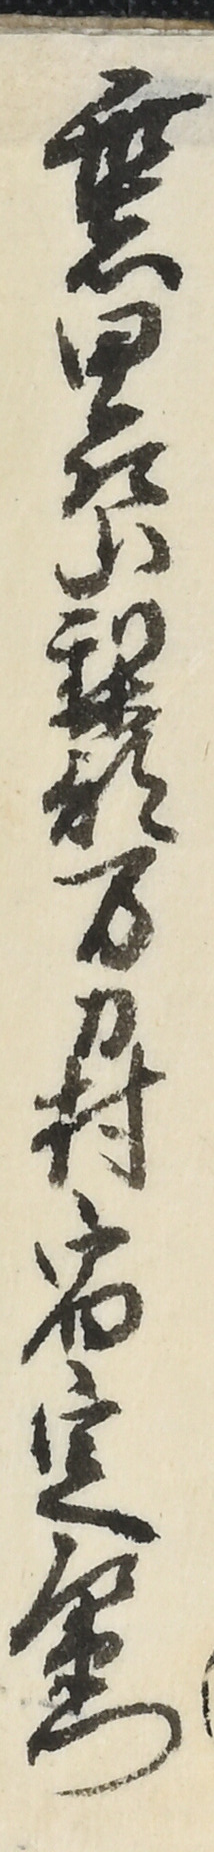此者甲州山梨郡万力村宿定左衛門
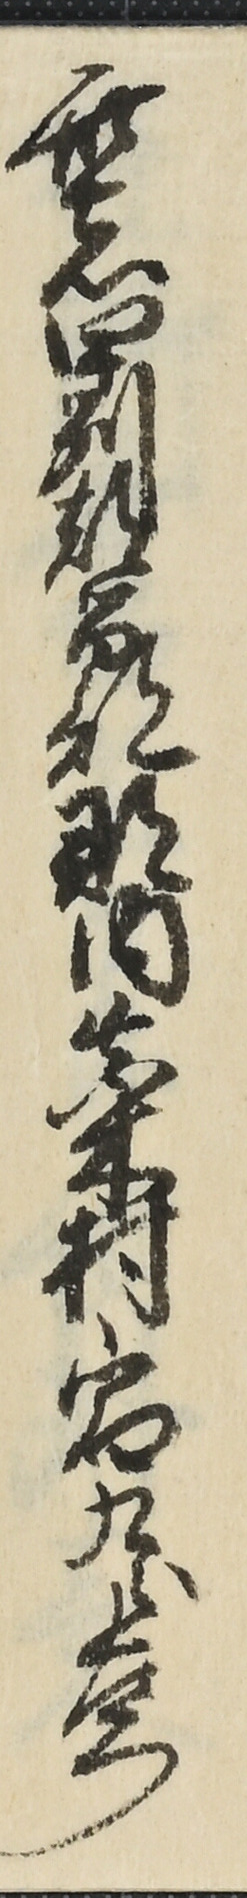此者甲州都留郡郡内真木村宿九郎右衛門
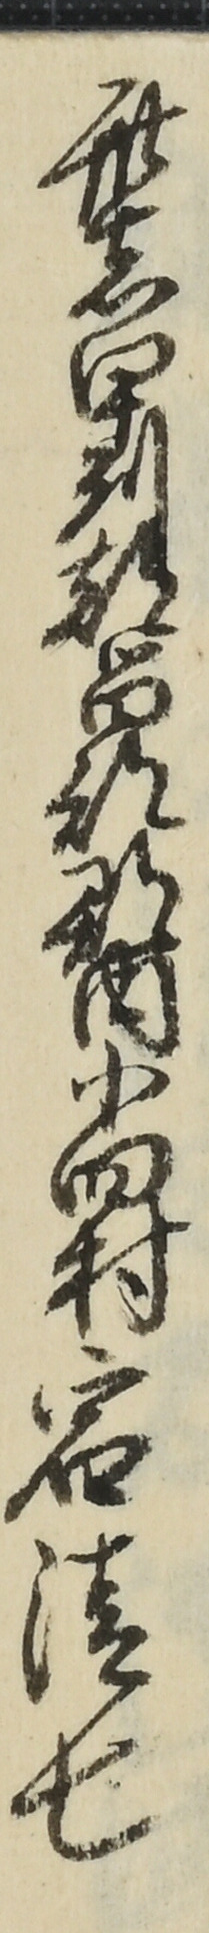此者甲州都留郡郡内小向村宿清七

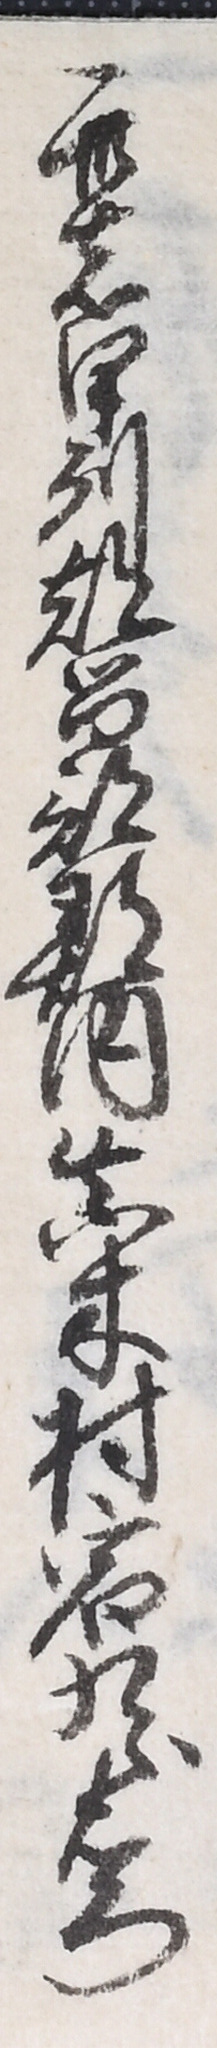此者甲州都留郡郡内真木村宿九郎右衛門
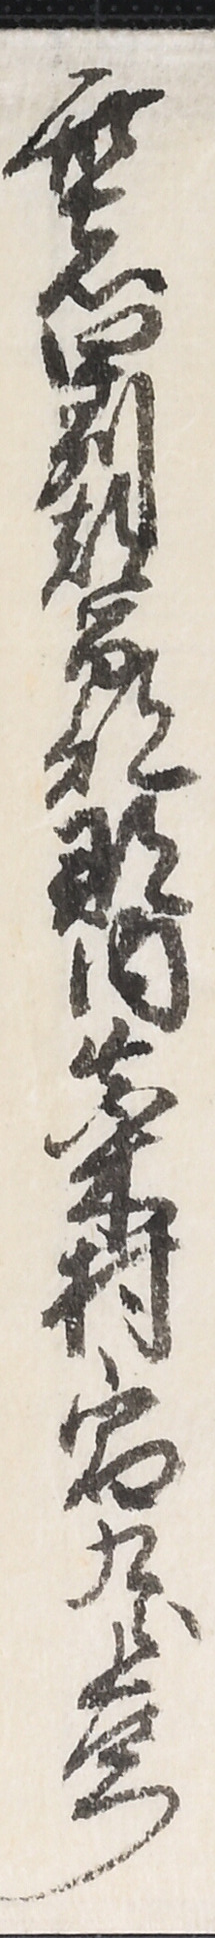此者甲州都留郡郡内真木村宿九郎右衛門
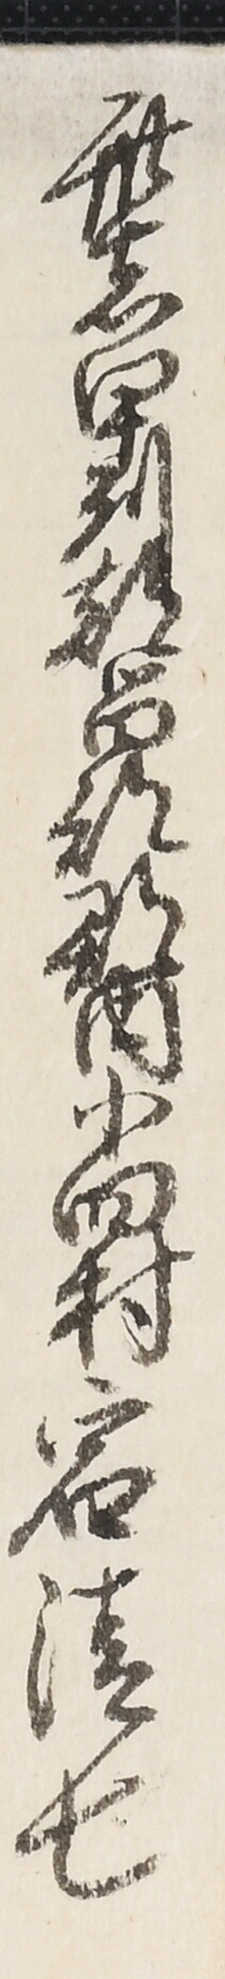此者甲州都留郡郡内小向村宿清七
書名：安政七庚申年正月他國出石切名前書上帳
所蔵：伊那市立高遠町図書館・合同会社AMANE
